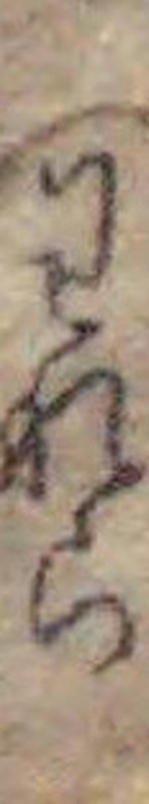われら
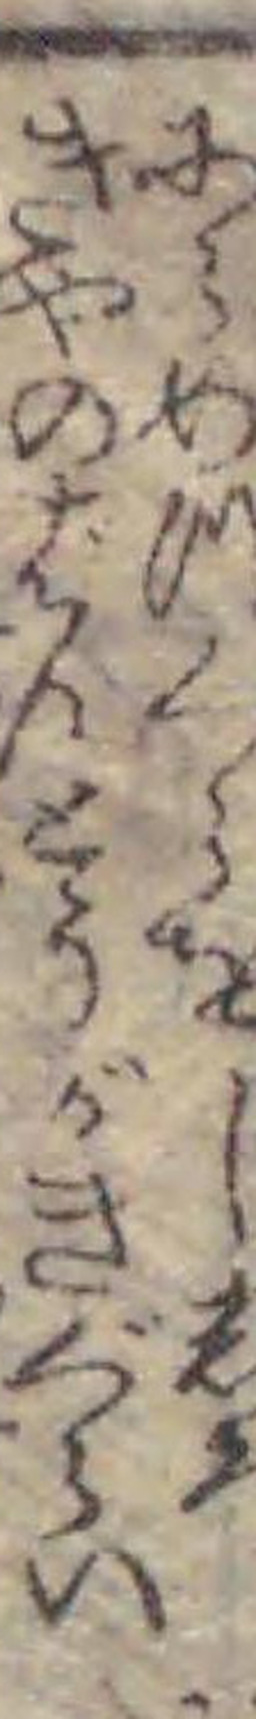きやのばんとうがきぐらい
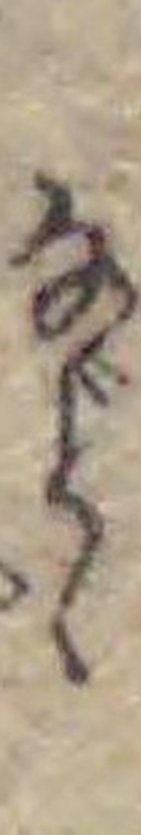などゝ
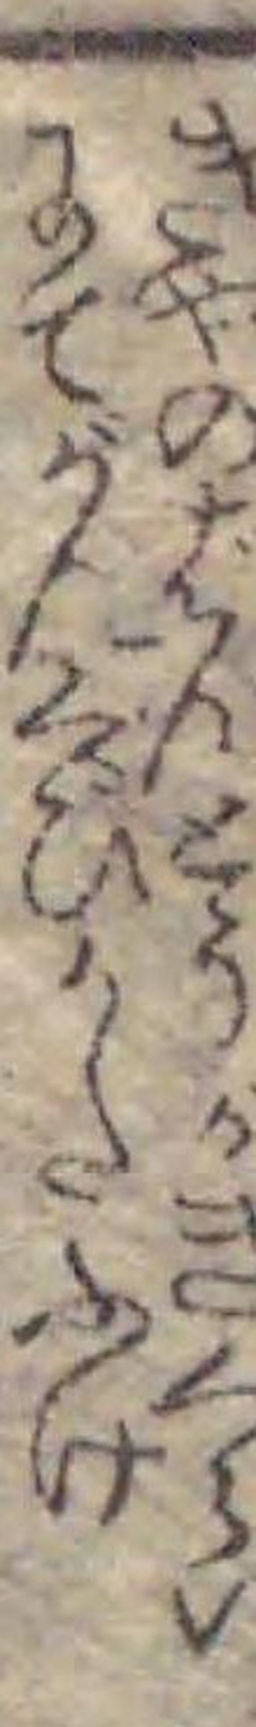にてがんくびかたふけ
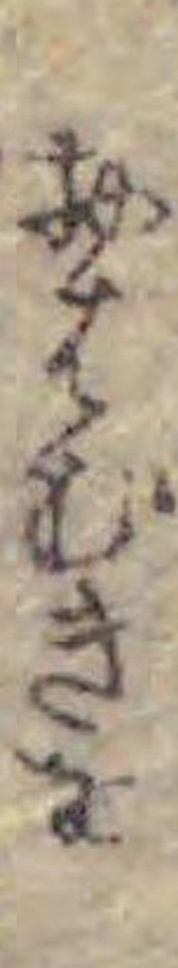おはむきを
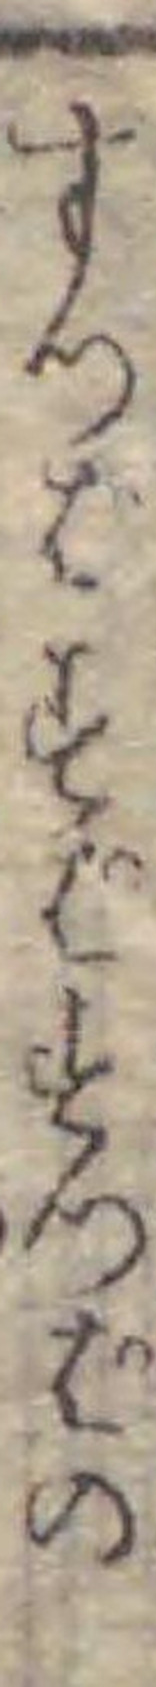すつばすばすつぱの
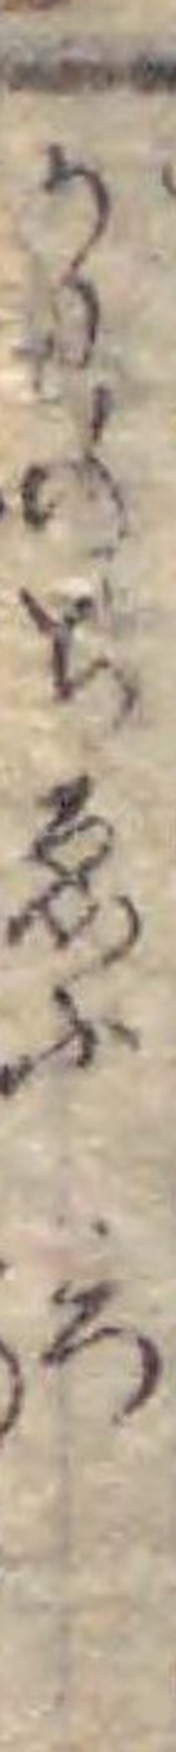かわのちゑふろ
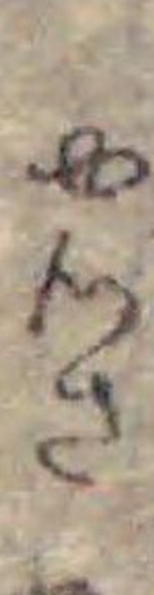やつさ
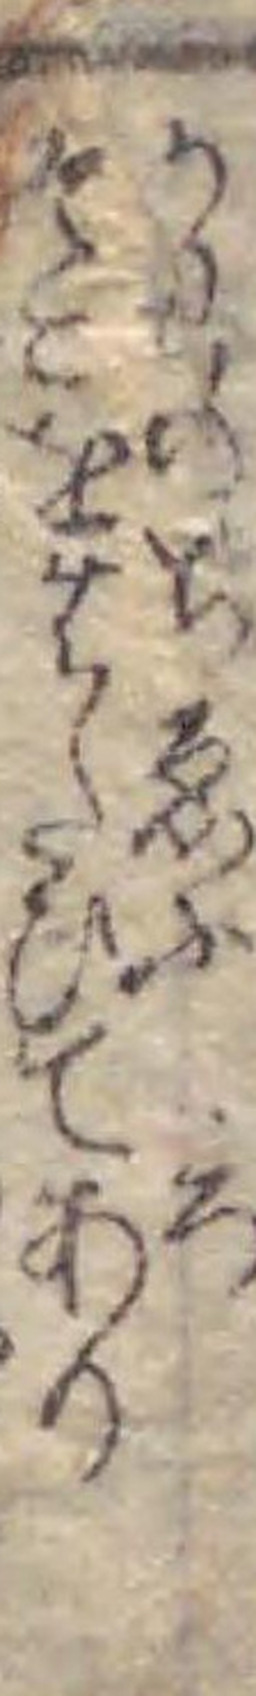そこをはたひてあり
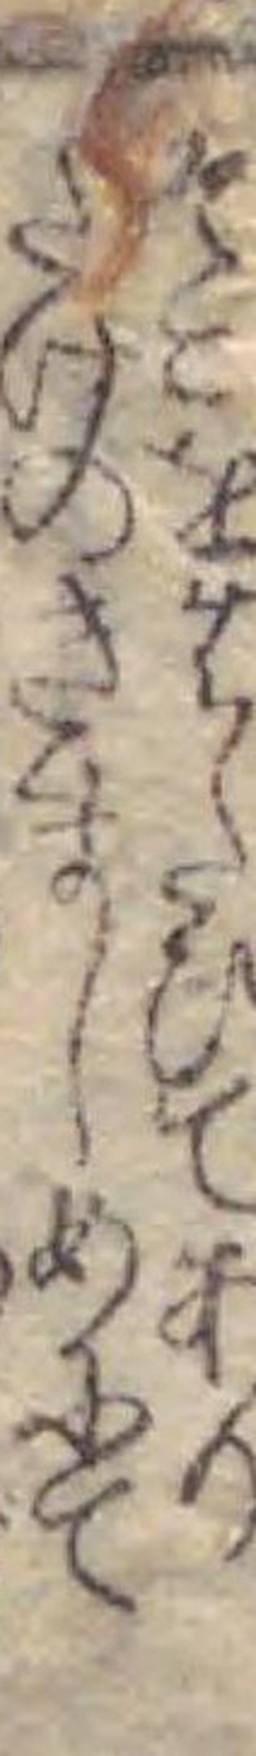たけのきましめにて
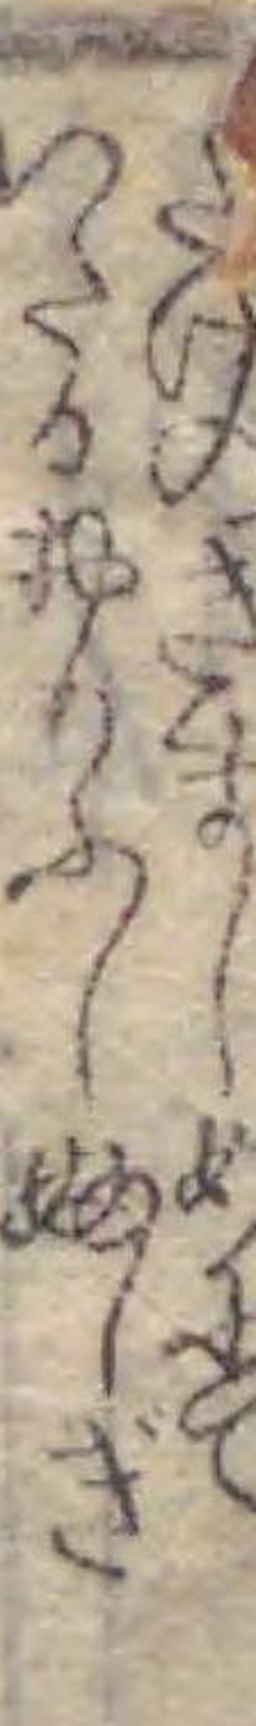いたるおりふしふしぎ
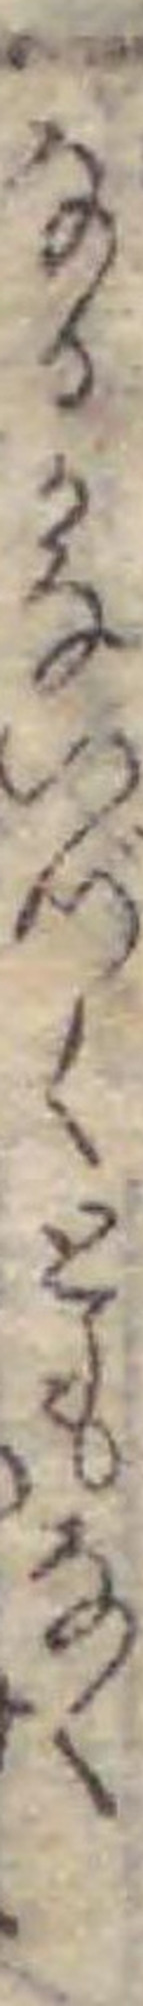なるかないづくともなく
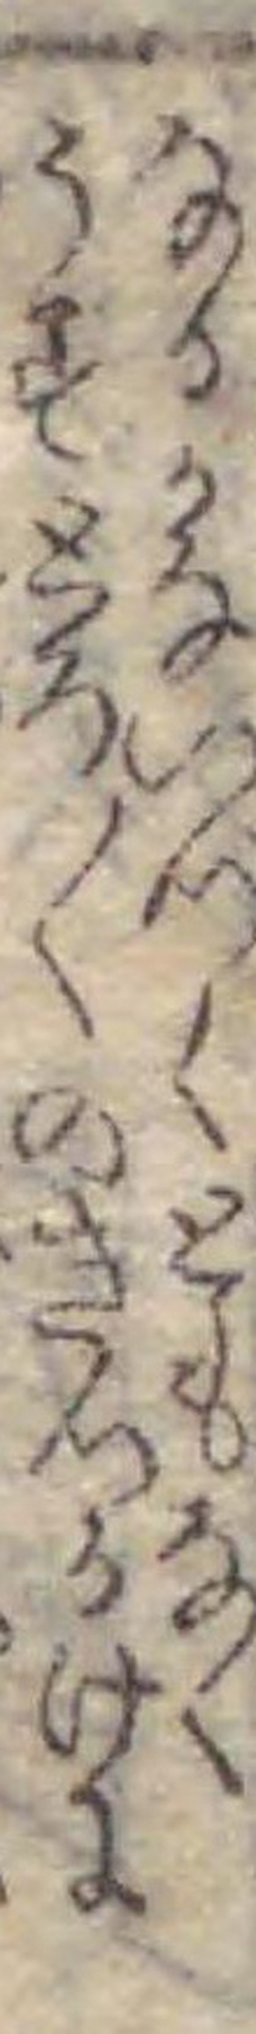うすとろ〳〵のきつかけに
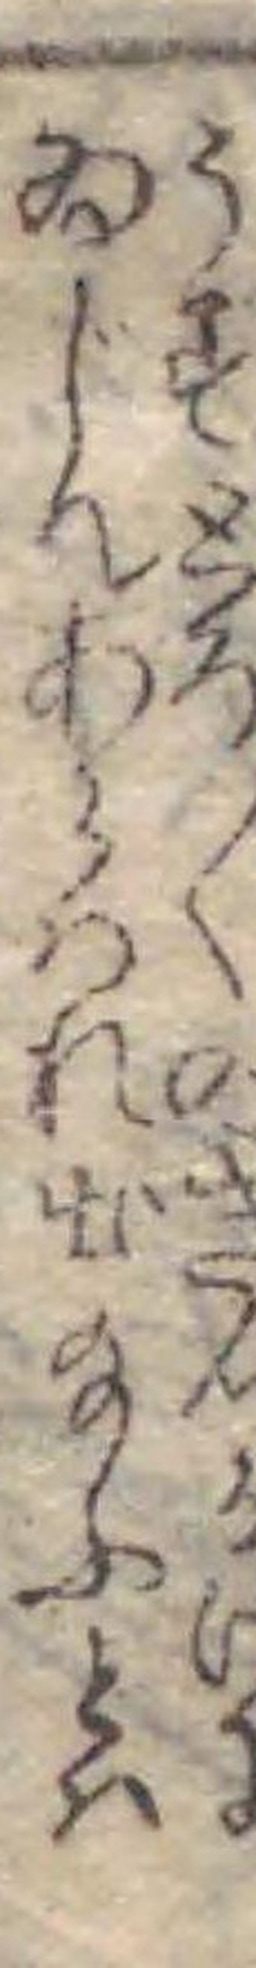ゐじんあらはれ出給ふとは
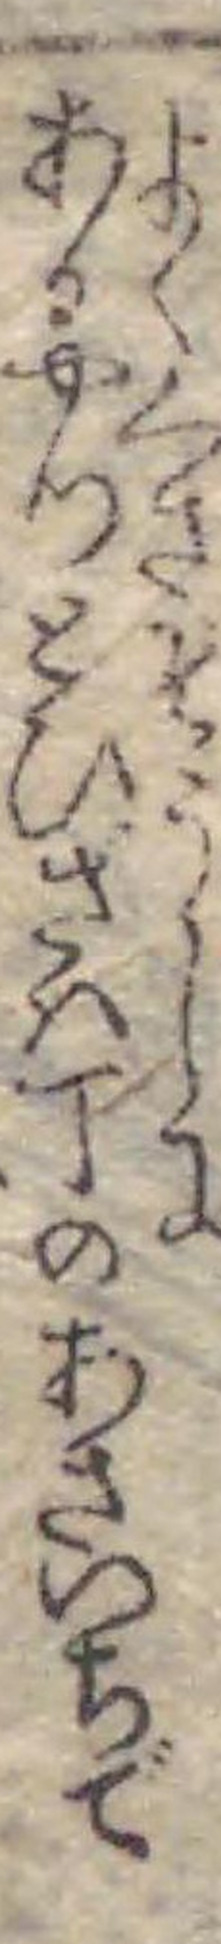あるやつとひざ八丁のあさいちで
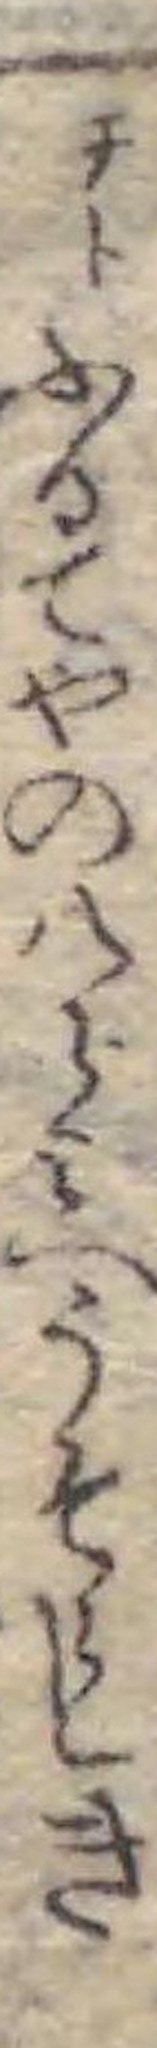チトふるてやの八ろうへうそらしき
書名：人間一心覗替繰 : 2巻
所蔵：国立国会図書館 National Diet Library, JAPAN
